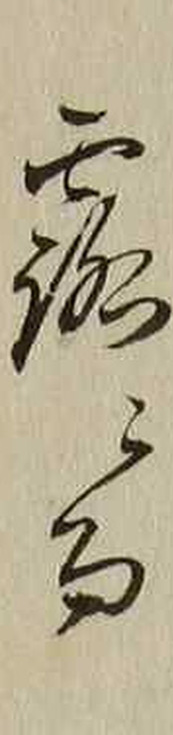露に而
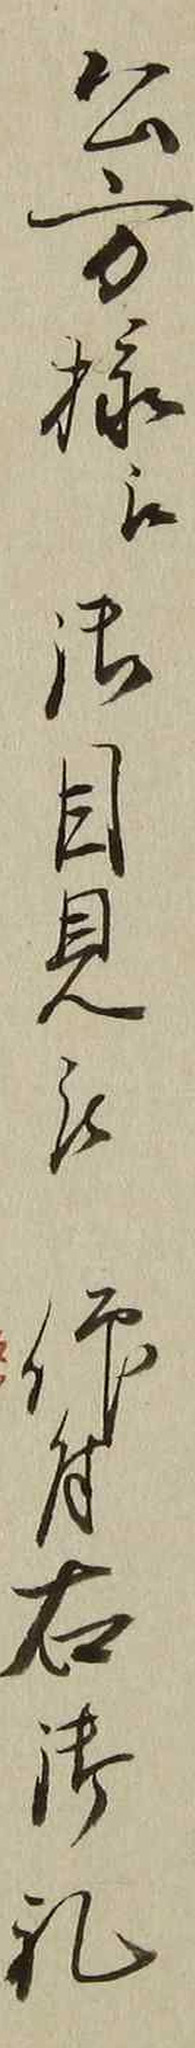公方様江御目見被仰付右御礼
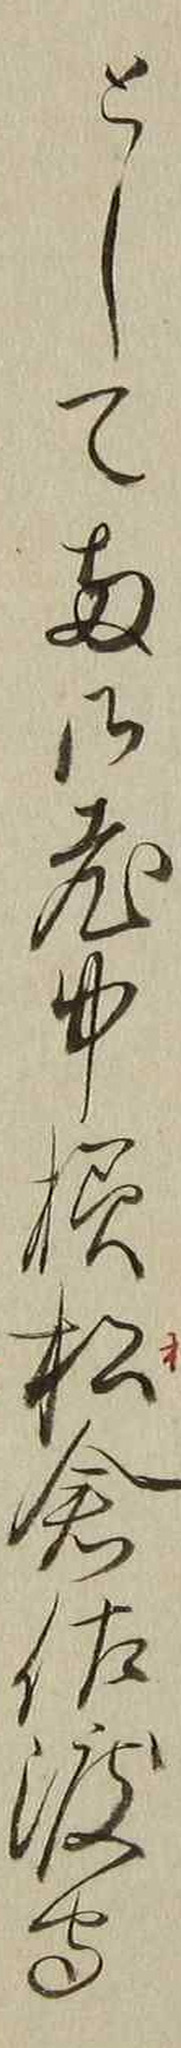として両御老中様松倉佐渡守
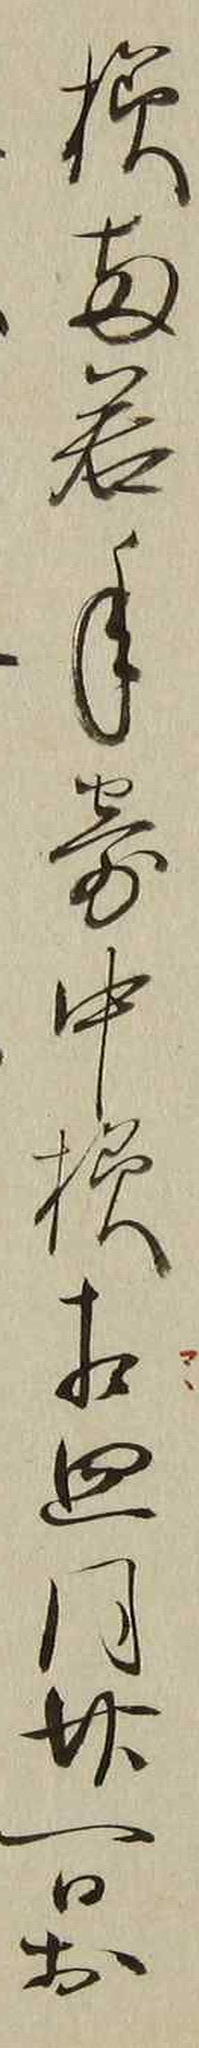様両若年寄中様相廻同廿一日於
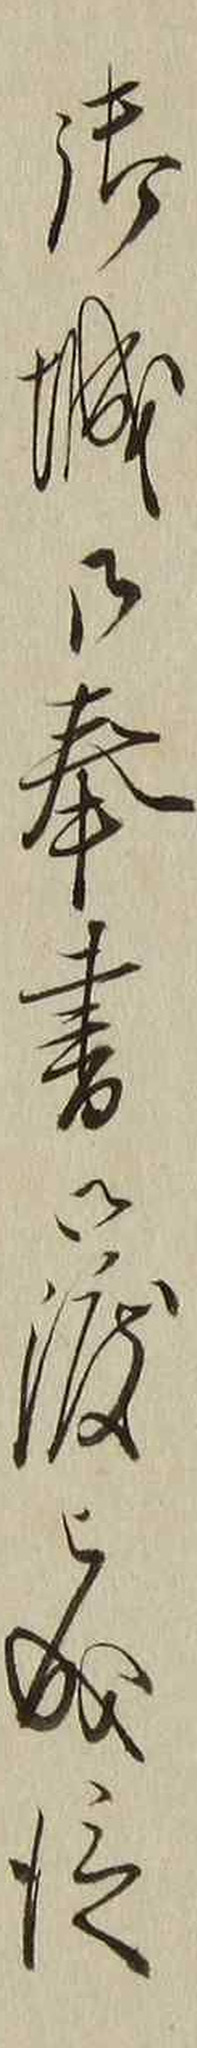御城御奉書御渡被成候従
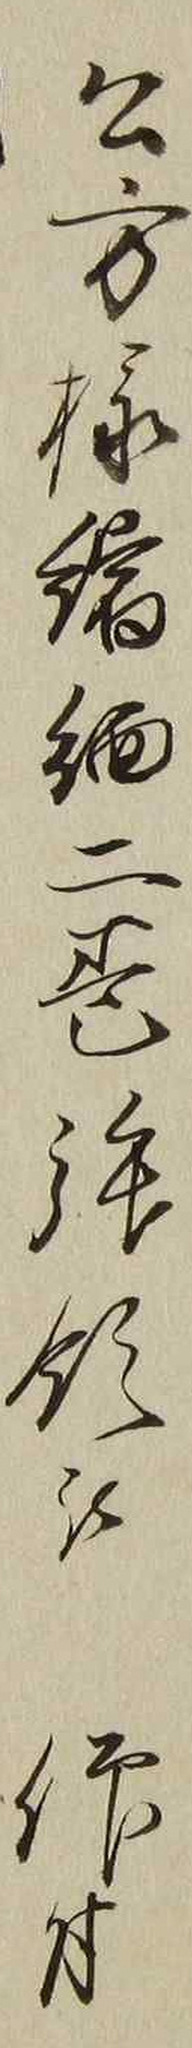公方様縮細二巻拝領被仰付
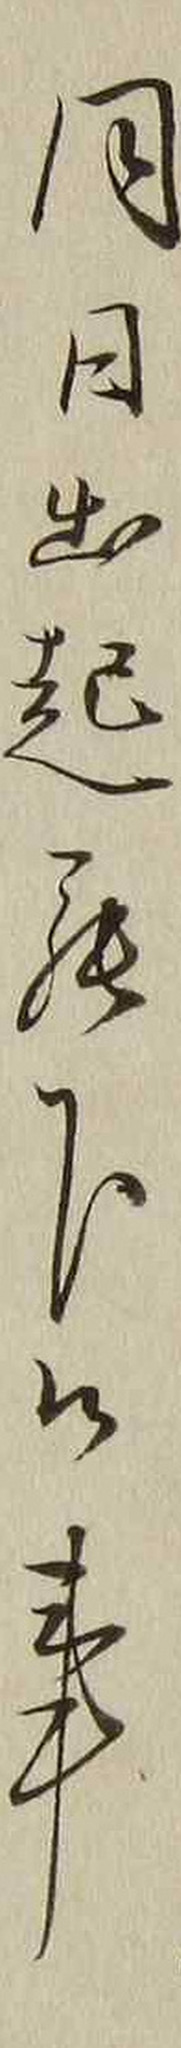同日出起罷下候事
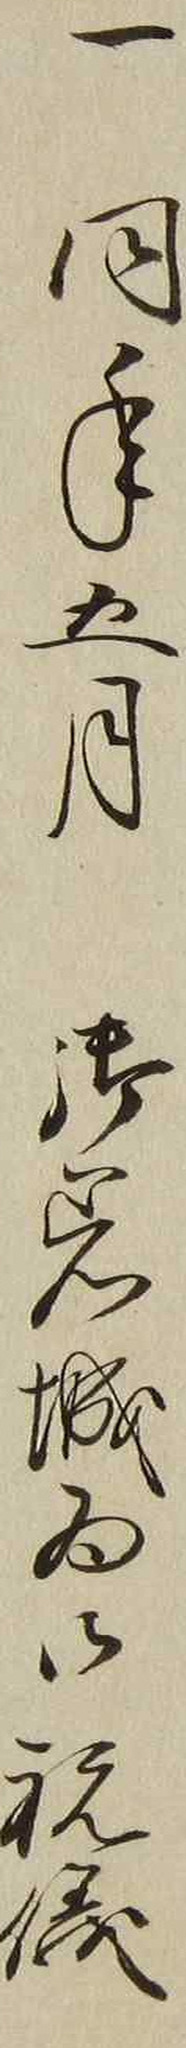一同年五月御着城為御祝儀
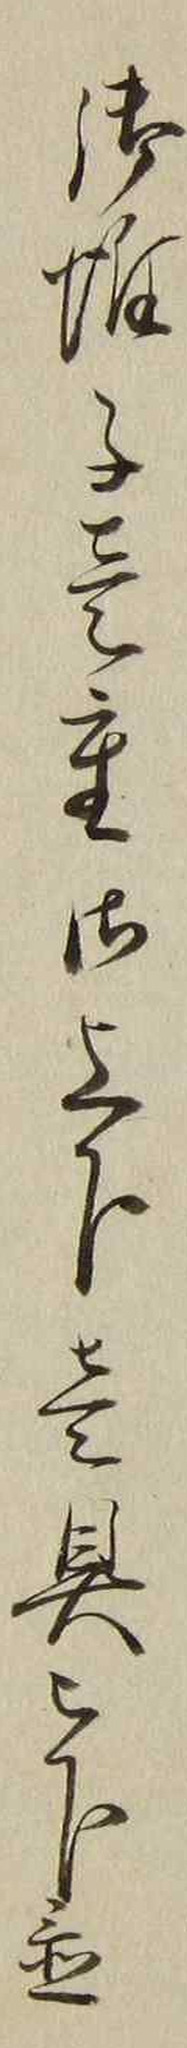御帷子壱重御上下壱具被下置
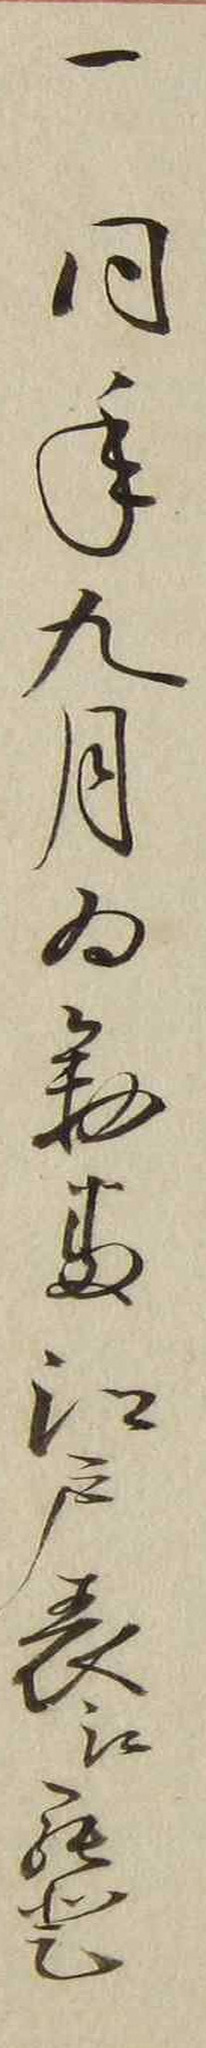一同年九月為勤番江戸表江罷登

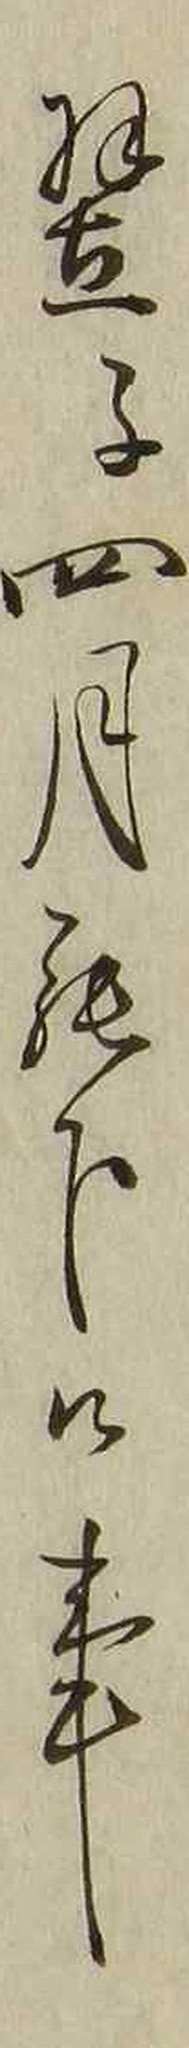翌子四月罷下候事
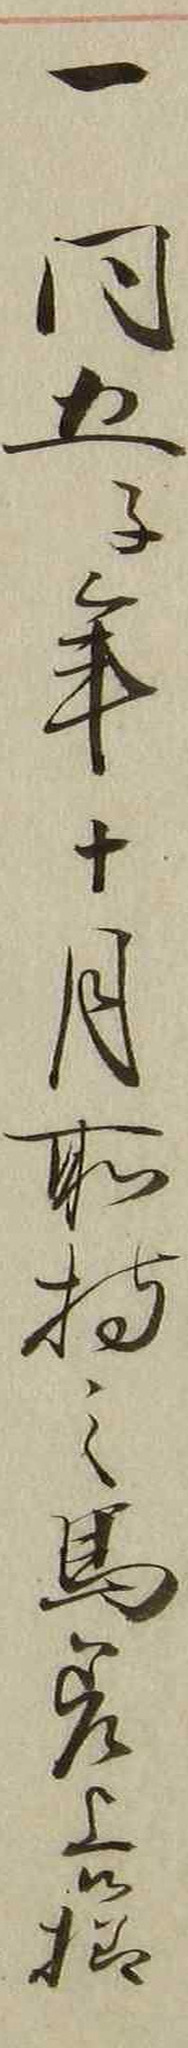一同五子年十月所持之馬差上候様
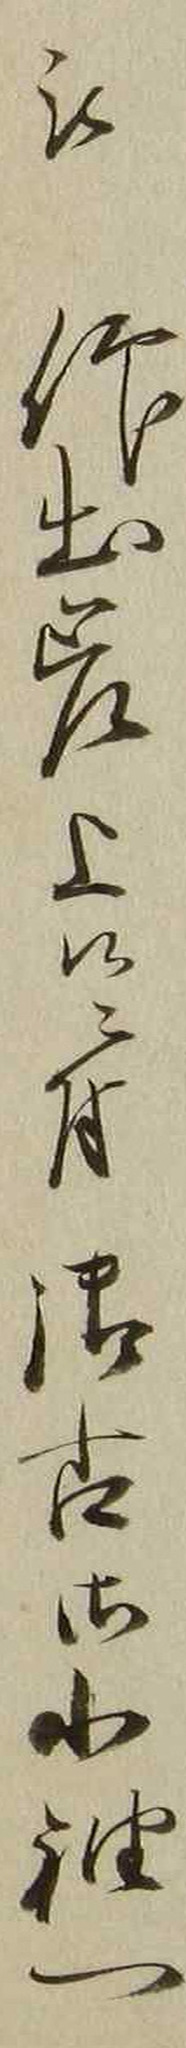被仰出差上候に付御古御小袖一
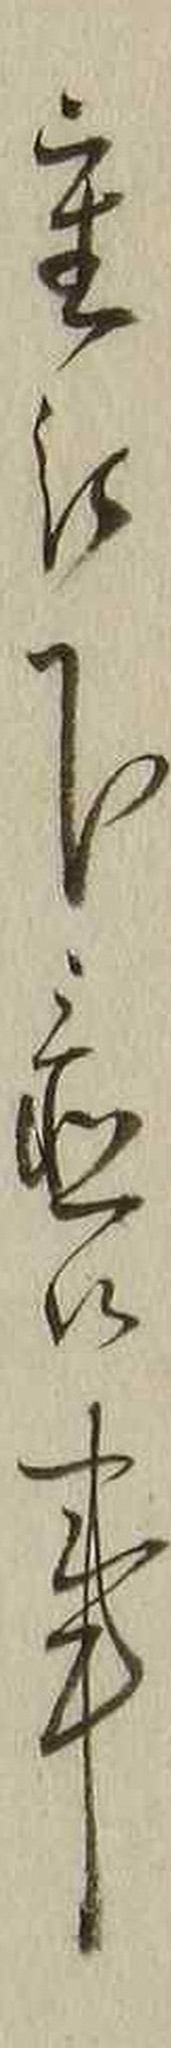重被下置候事
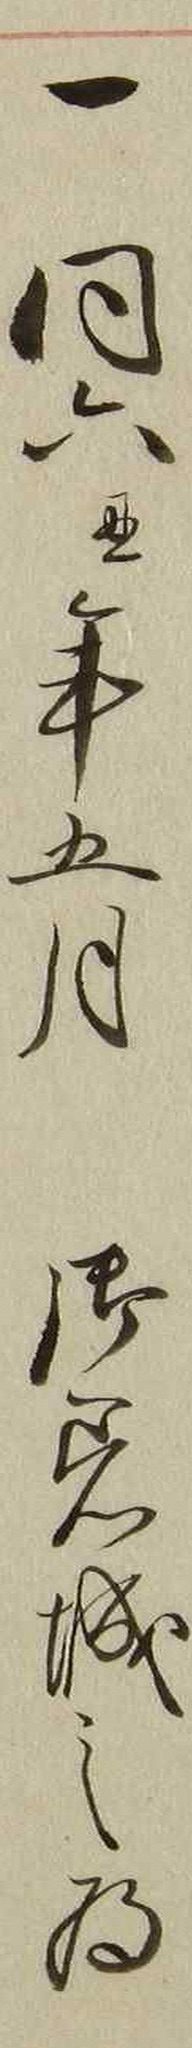一同六丑年五月御着城之為
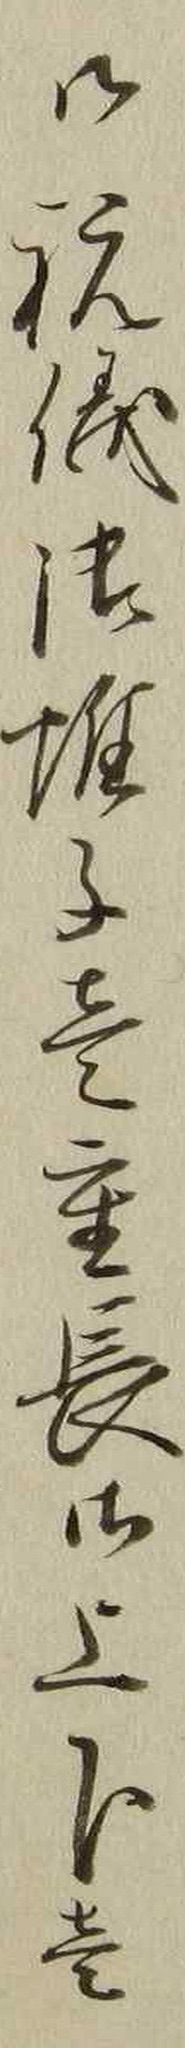御祝儀御帷子壱重長御上下壱
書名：諸士系譜　巻之103　か之部11
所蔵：会津若松市立会津図書館
